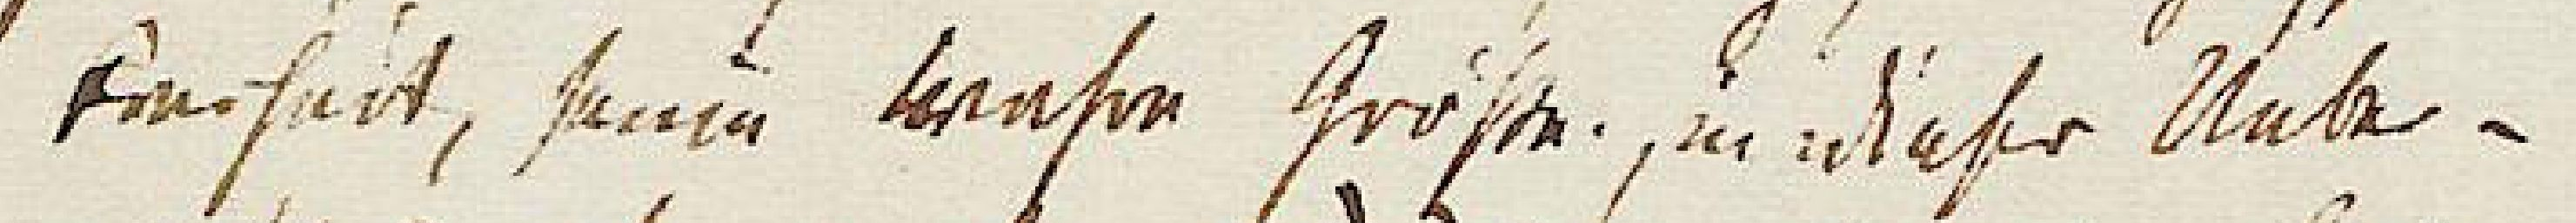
Freiheit, seine wahre Größe, zu dieser Ueber¬
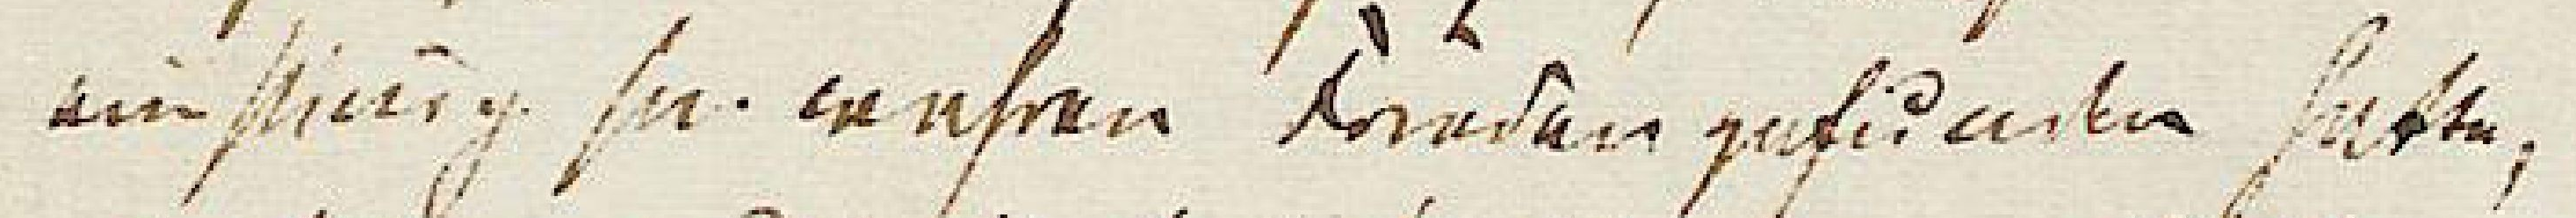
einstimung sn wahren Freuden gefunden hatte;
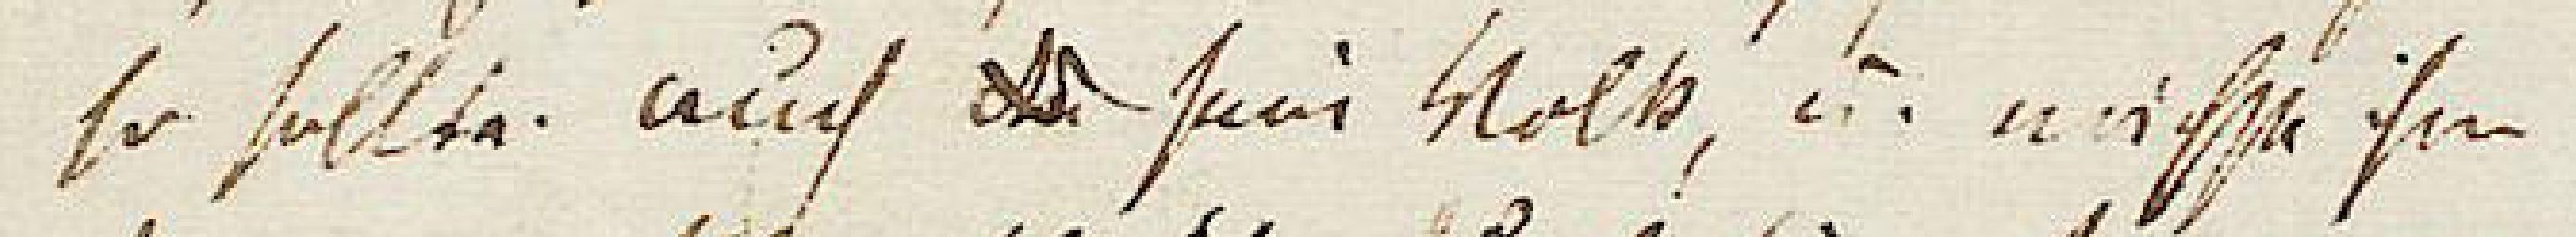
so sollte auch dm sein Vok, u nächste ihm
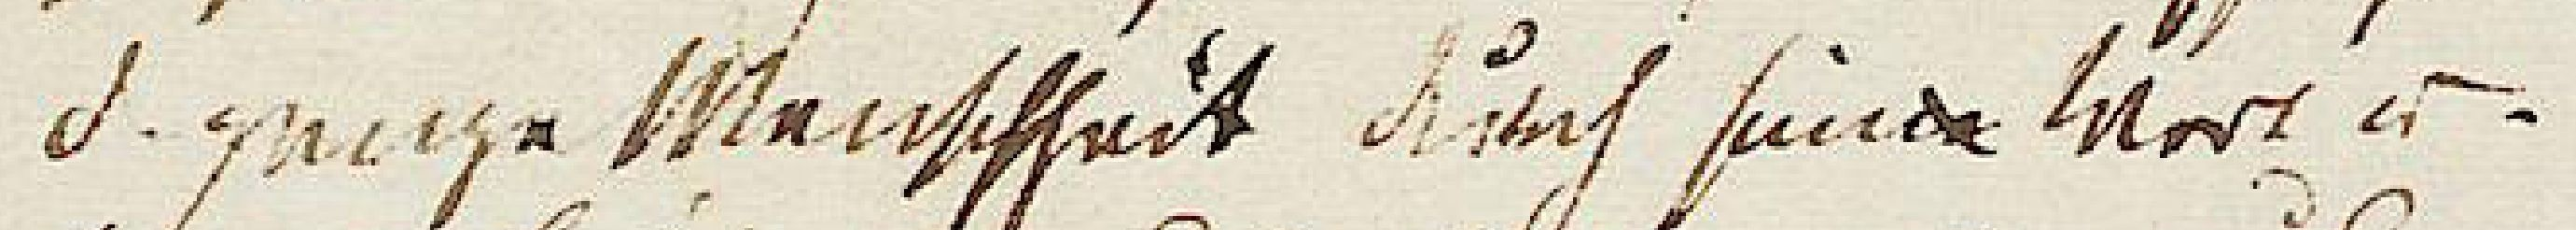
d. ganze Menschheit durch seine Wort u.
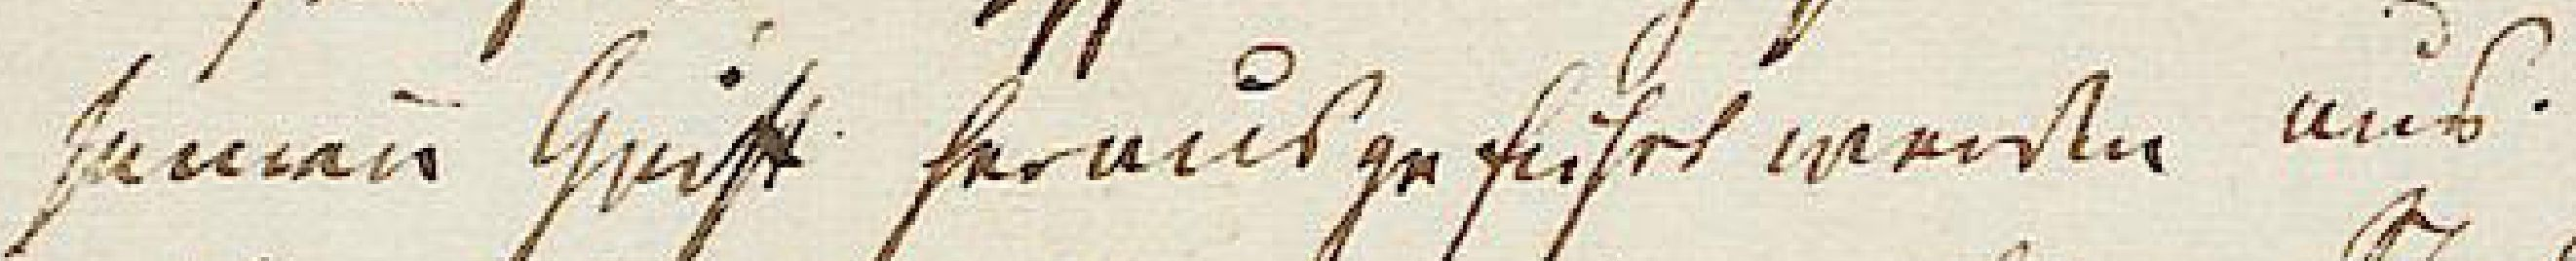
seinen Geist herausgeführt werden aus
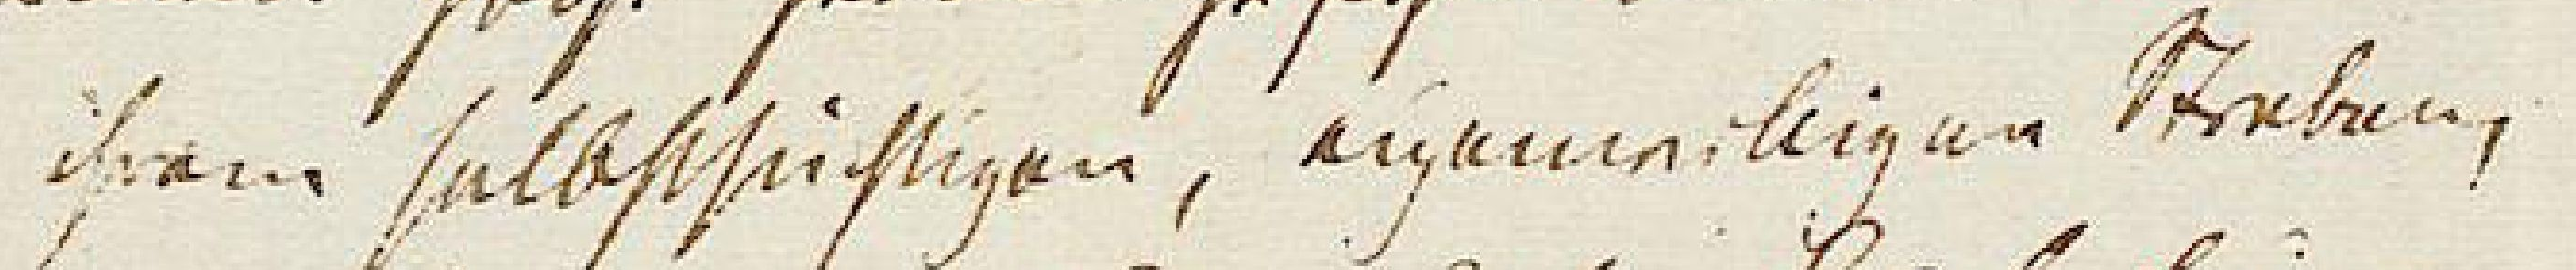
ihrem selbstsüchtigen, eigenwilligen Streben,
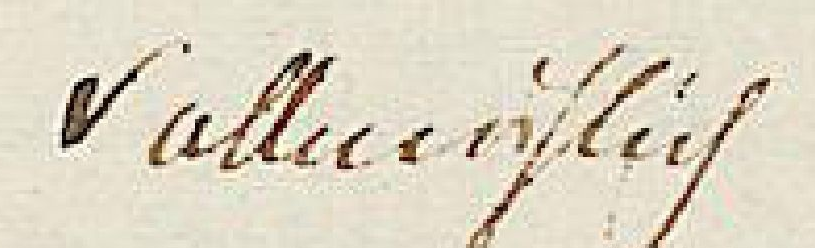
V allmählich
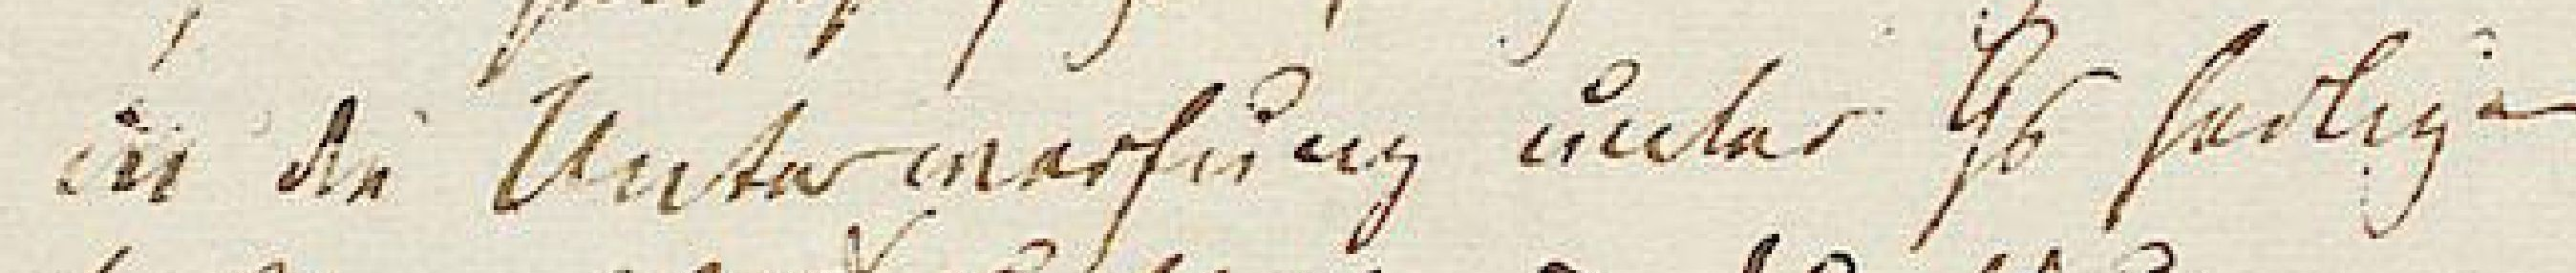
in die Unterwerfung unter Gs heiligen
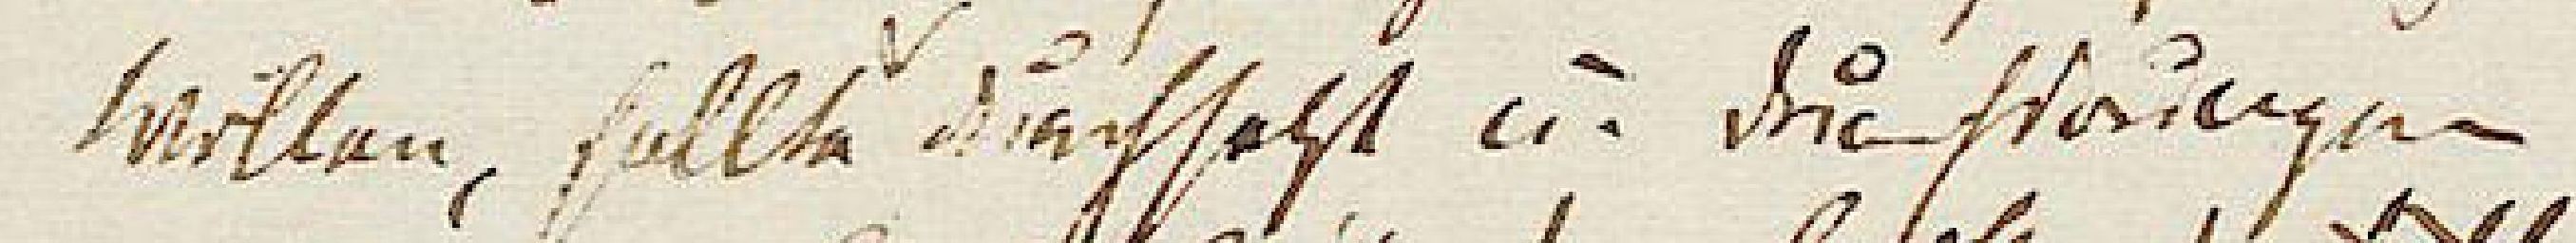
Willen, sollte durchsetzt u. durchdrungen
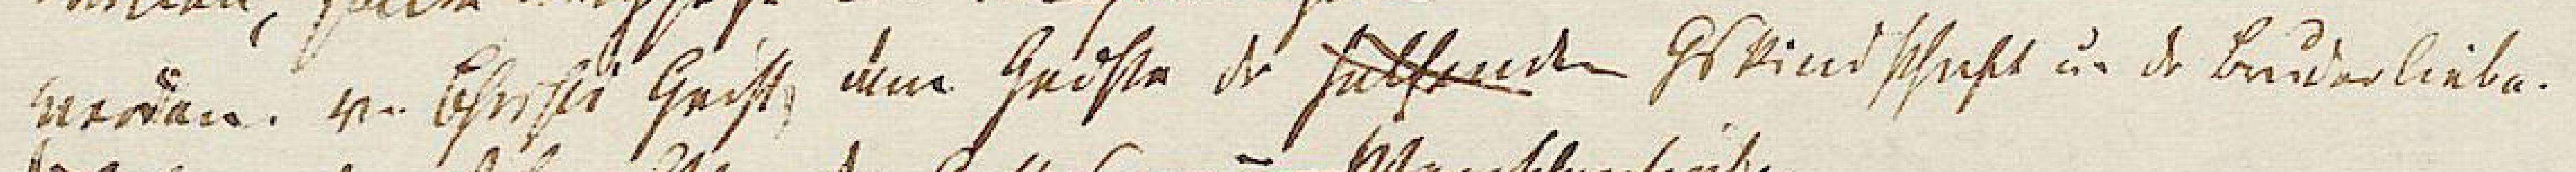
werden. v. Christi Geist, dem Geist dr. helfenden Gskindschaft u. dr. Bruderliebe.
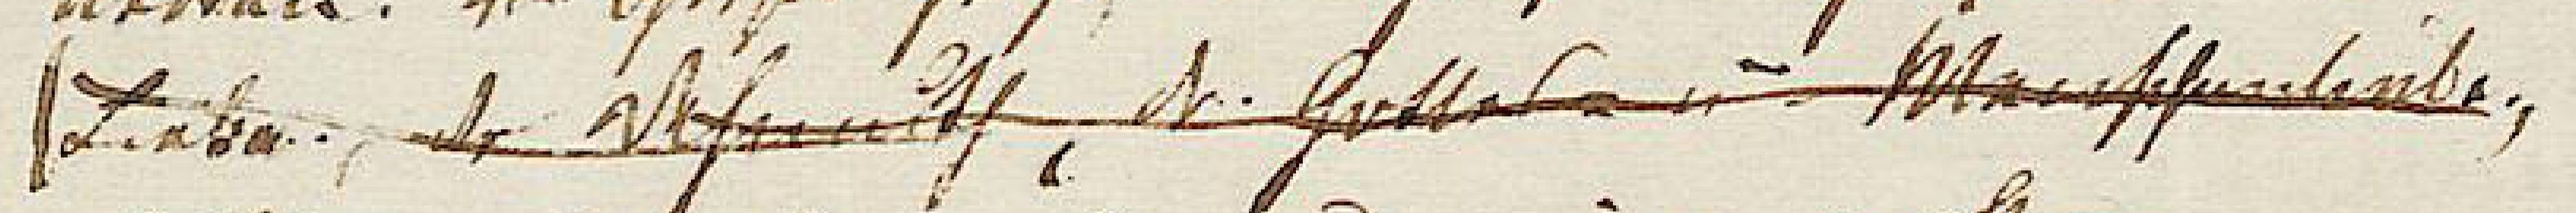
[Liebe, dr. Dehmuth, der Gottes- und Menschenliebe,
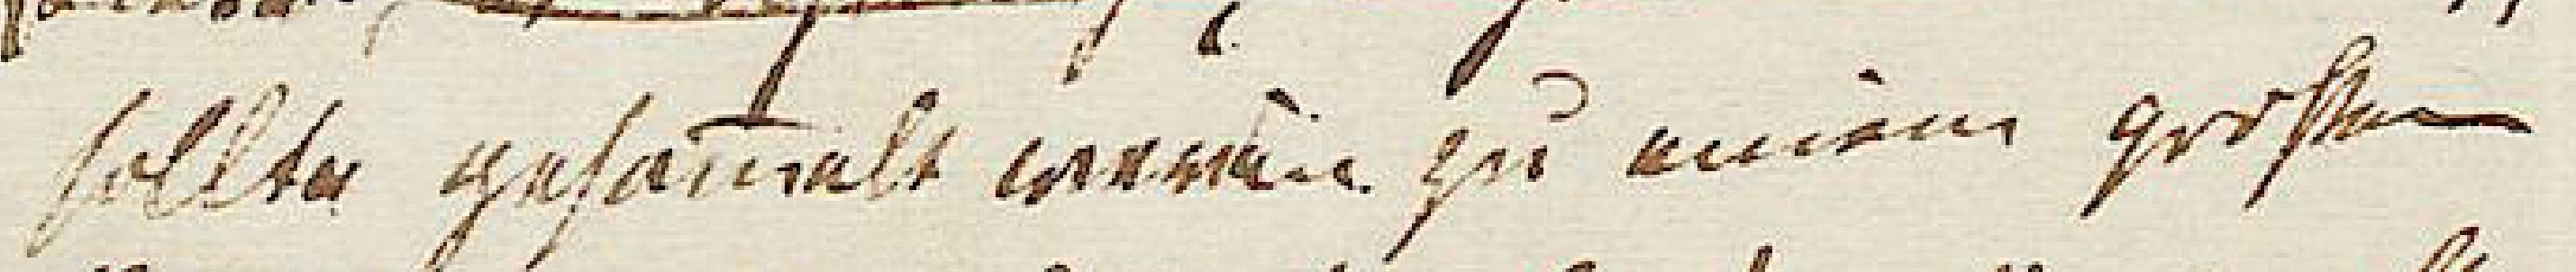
sollte gesamelt werden zu einem großen
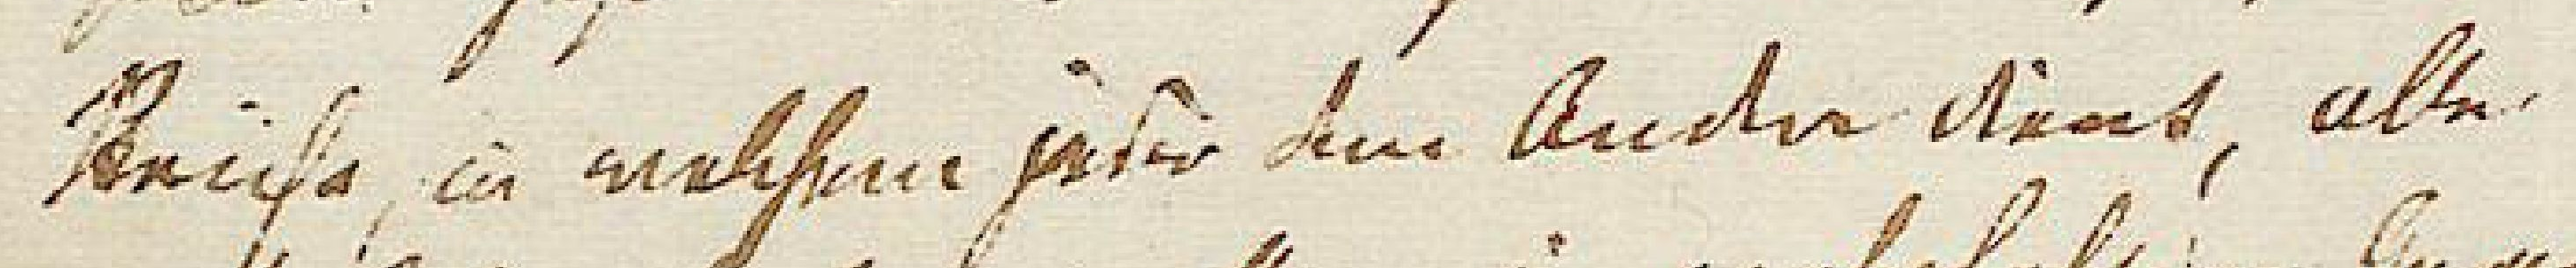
Reiche, in welchem jeder dem Andren dient, alte
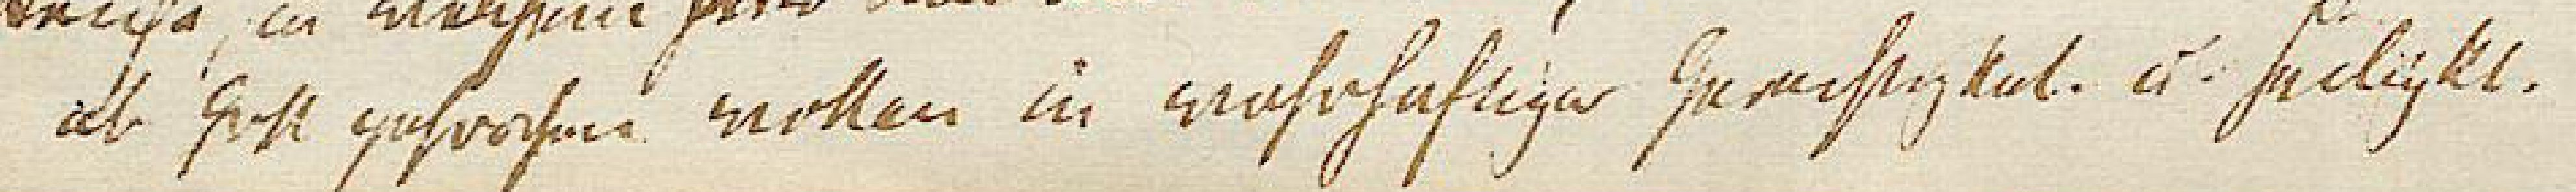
alle Gott gehorchen wollten in wahrhaftiger Gerechtigkeit u. Seeligkt.
